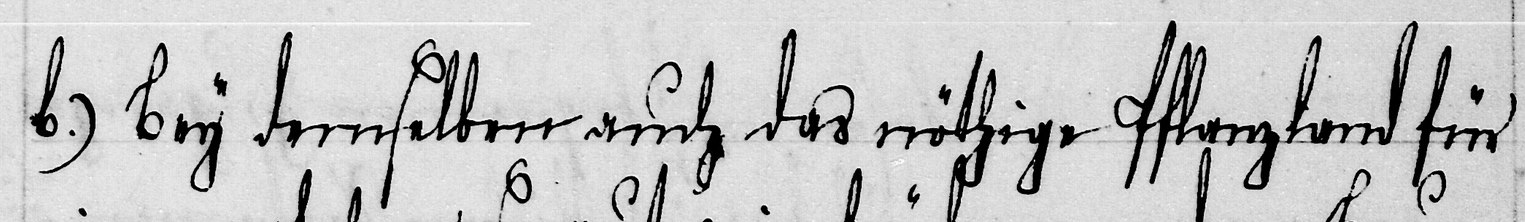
b.) Bey demselben auch das nöthige Pflanzland für
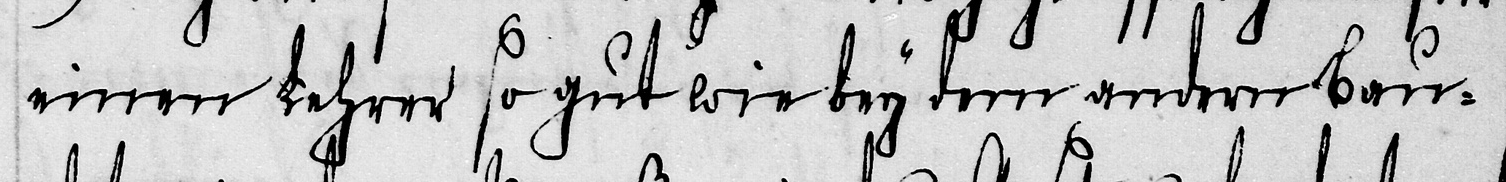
einen Lehrer so gut wie bey dem andern Bau¬
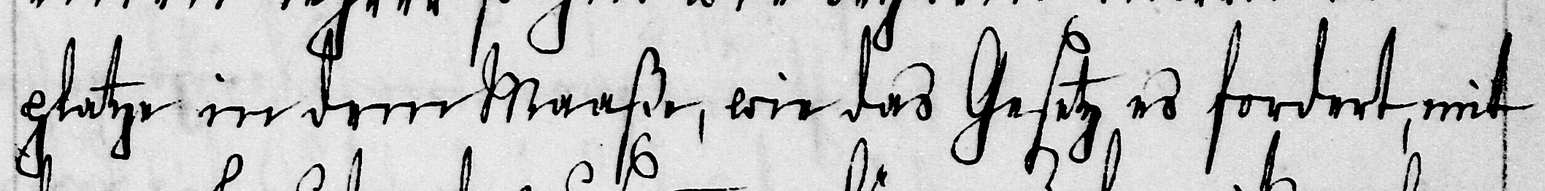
platze in dem Maaße, wie das Gesetz es fordert, mit
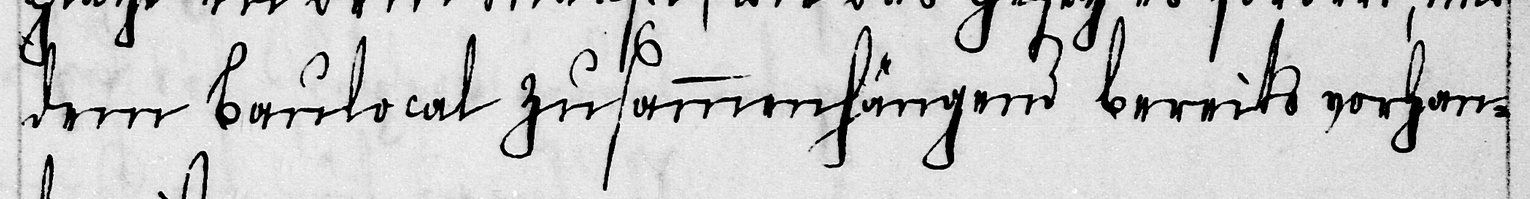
dem Baulocal zusammenhängend bereits vorhan¬
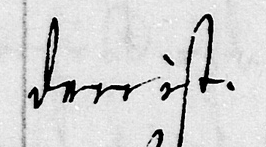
den ist.
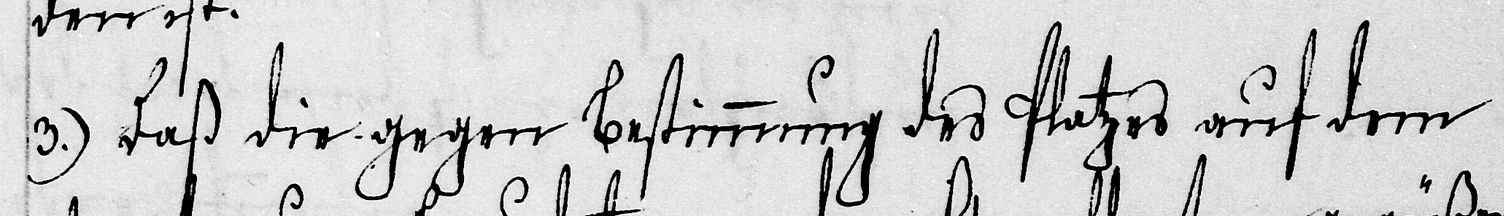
3.) Daß die gegen Bestimmung des Platzes auf dem
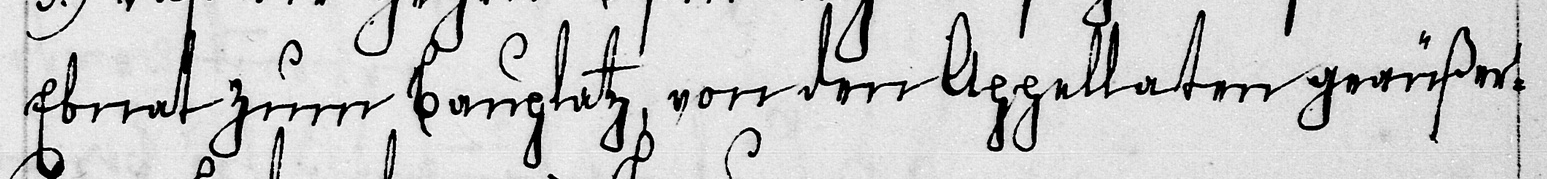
Ebnat zum Bauplatz, von den Appellaten geäußer¬
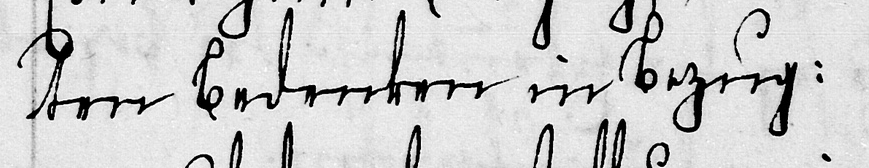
ten Bedenken in Bezug:
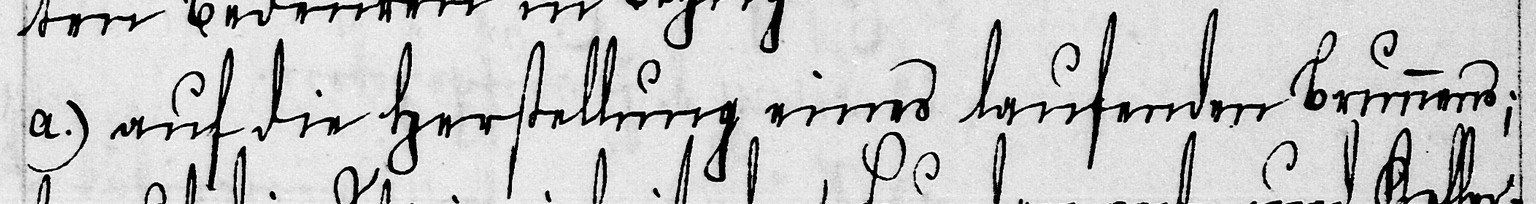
a.) auf die Herstellung eines laufenden Brunnen¬
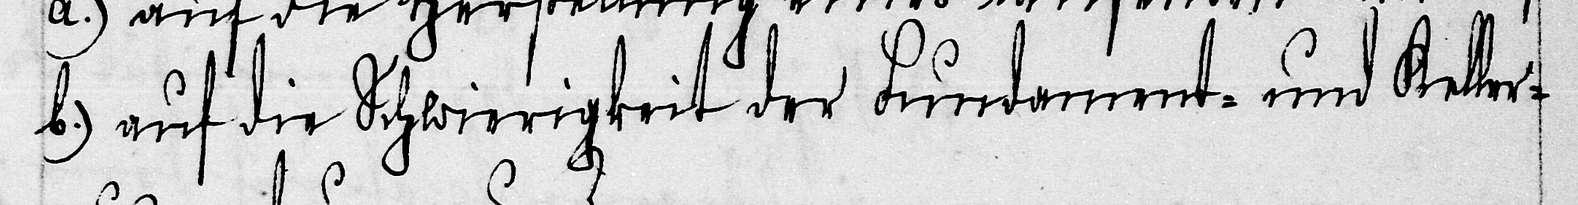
b.) auf die Schwierigkeit der Fundament- und Keller¬
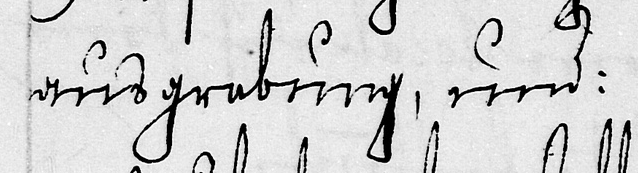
ausgrabung, und:
